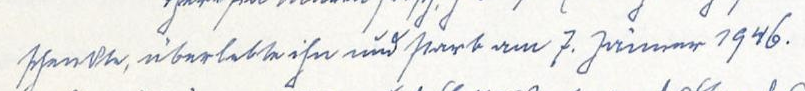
schenkte überlebte ihn und starb am 7. Jänner 1946
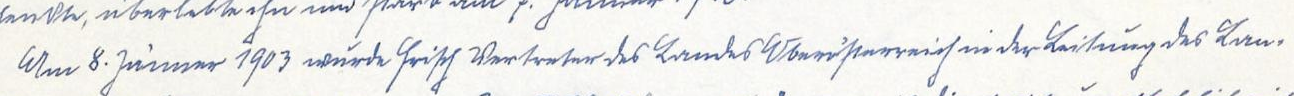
Am 8. Jänner 1903 wurde frisch Vertreter des Landes Oberösterreich in der Leitung des Lan-
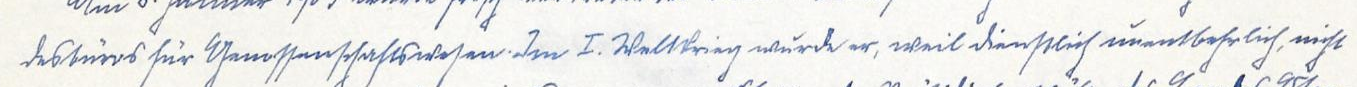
desbüros für Genossenschaftswesen. Im I. Weltkrieg wurde er, weil dienstlich unentbehrlich, nicht
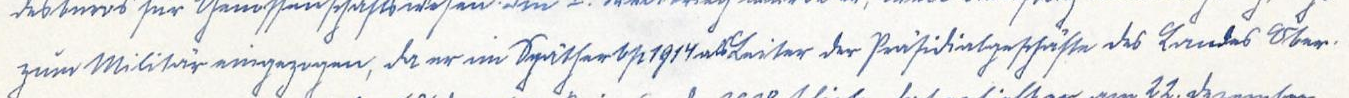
zum Militär eingezogen, da er im Spätherbst 1914 als Leiter der Präsidialgeschäfte des Landes Ober-
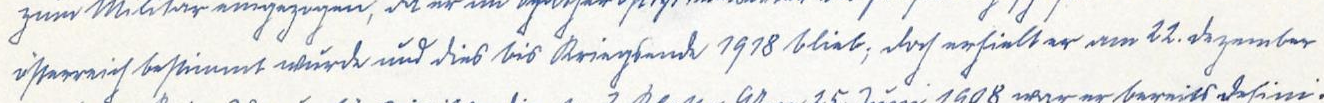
österreich bestimmt wurde und dies bis Kriegsende 1918 blieb; doch erhielt er am 22. Dezember
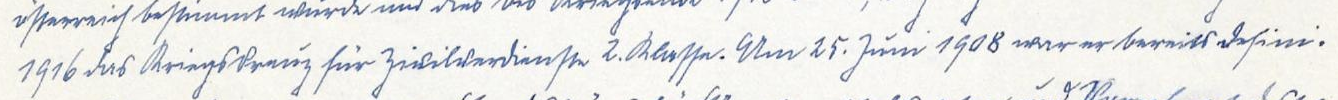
1916 dss Kriegskreuz für Zivilverdienste 2. Klasse. Am 25. Juni 1908 war er bereits defini-
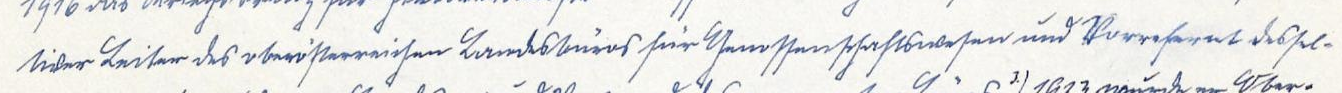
tiver Leiter des oberösterreichischen Landesbüros für Genossenschaftswesen und Vorreferent dessel-
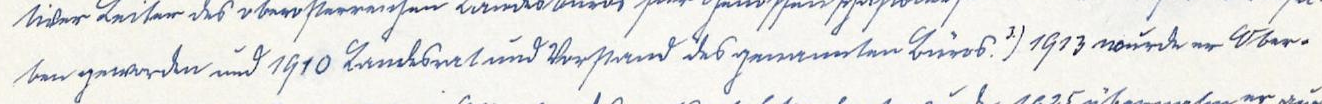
ben geworden und 1910 Landesrat und Vorstand des genannten Büros. 3) 1913 wurde er Ober
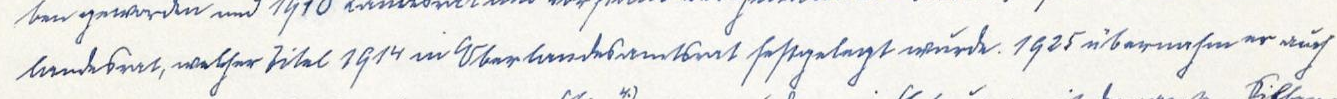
landesrat, welcher Titel 1914 in Oberlandesamtsrat festgelegt wurde. 1925 übernahm er auch
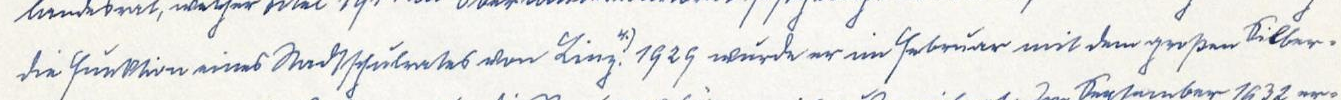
die Funktion eines Stadtschulrates von Linz. 4) 1929 wurde er im Februar mit dem großen Silber-
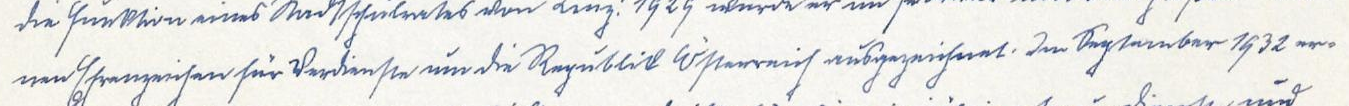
nen Ehrenzeichen für Verdienste um die Republik Österreich ausgezeichnet. Im September 1932 er-
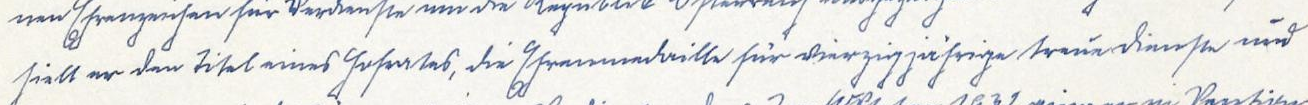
hielt er den Titel eines Hofrates, die Ehrenmedaille für vierzig jährige treue Dienste und
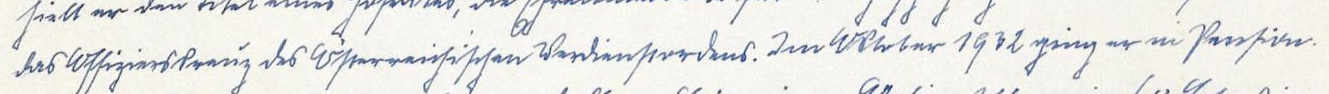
das Offizierskreuz des Österreichischen Verdienstordens. Im Oktober 1932 ging er in Pension.
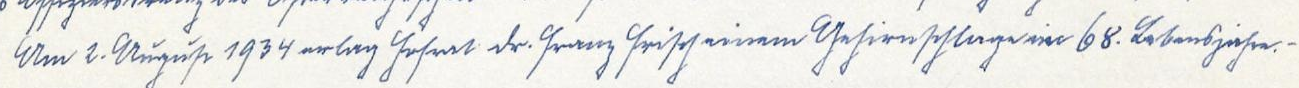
Am 2. August 1934 erlag Hofrat Dr. Franz Frisch einen Gehinrschlage im 68. Lebensjahr.
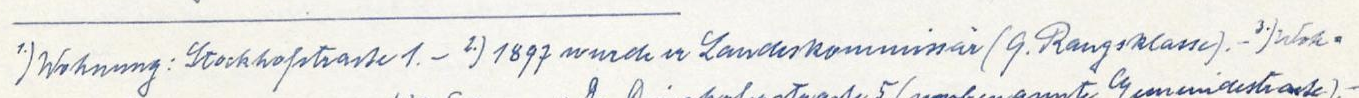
1) Wohnung: Stockhofstraße 1.- 2) 1897 wurde er Landeskommissär (9. Rangsklasse).- 3) Woh-
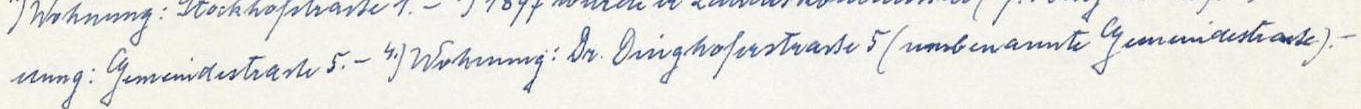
nung: Gemeindestraße 5.- 6) Wohnung: Dr. Dinghoferstraße 5 (umbenannte Gemeindestraße).
